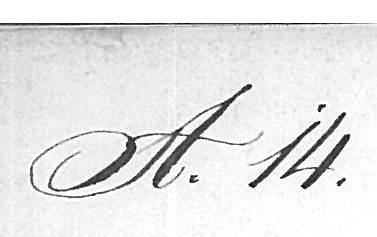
A. 14.
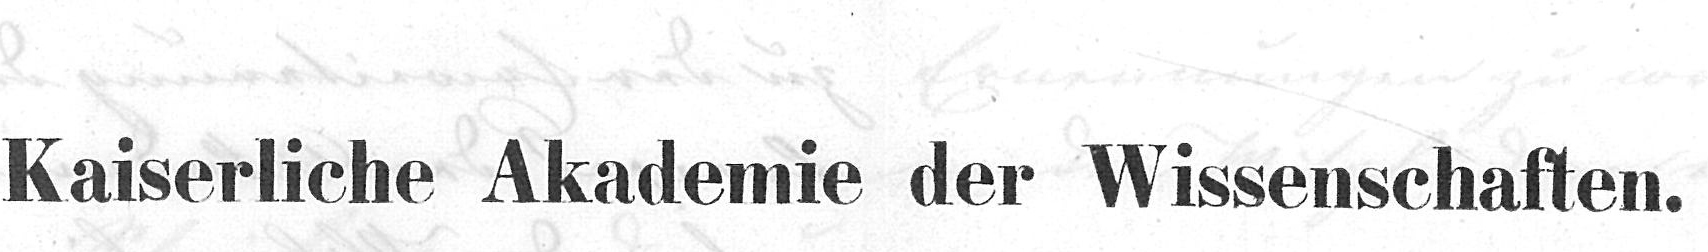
Kaiserliche Akademie der Wissenschaften.
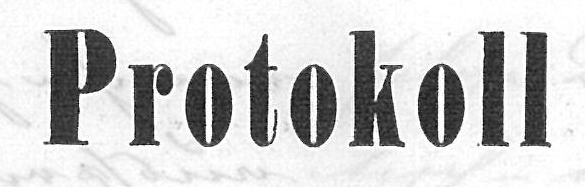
Protokoll
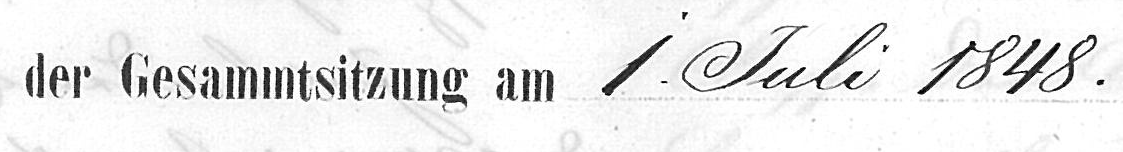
der Gesammtsitzung vom 1. Juli 1848.
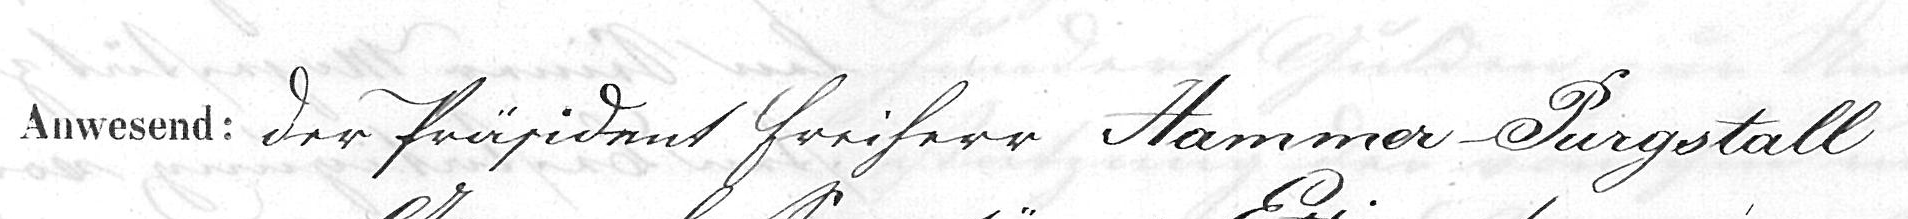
Anwesend: der Präsident Freiherr Hammer-Purgstall
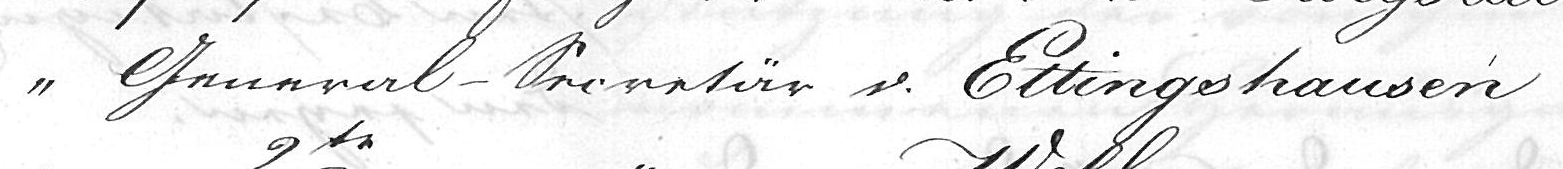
" General-Secretär v. Ettingshausen
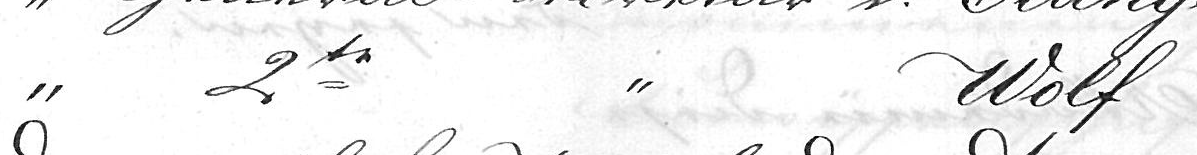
" 2te " Wolf
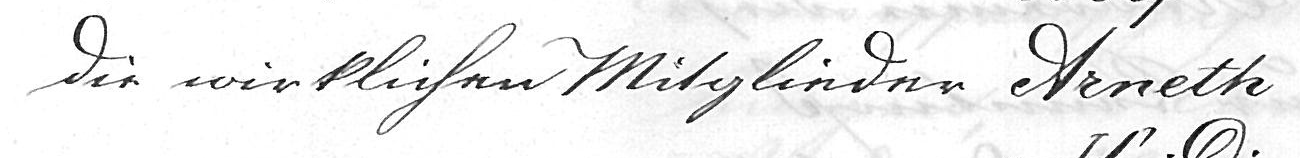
die wirklichen Mitglieder Arneth
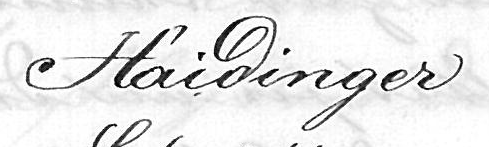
Haidinger
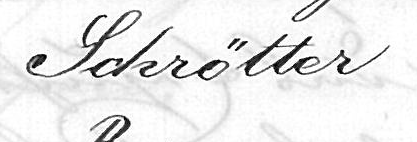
Schrötter
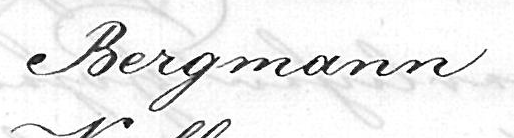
Bergmann
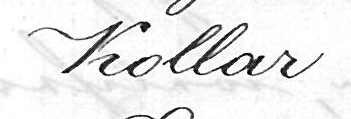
Kollar
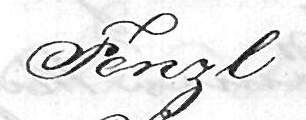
Fenzl
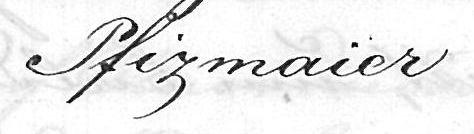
Pfizmaier
